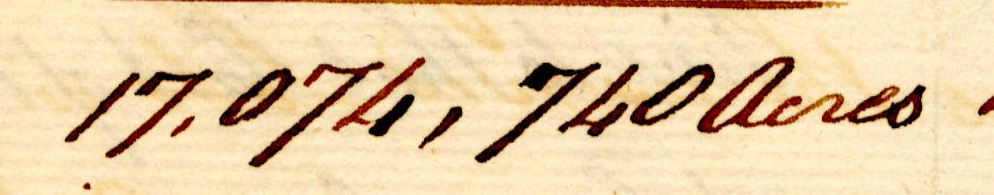17,074,740 Acres
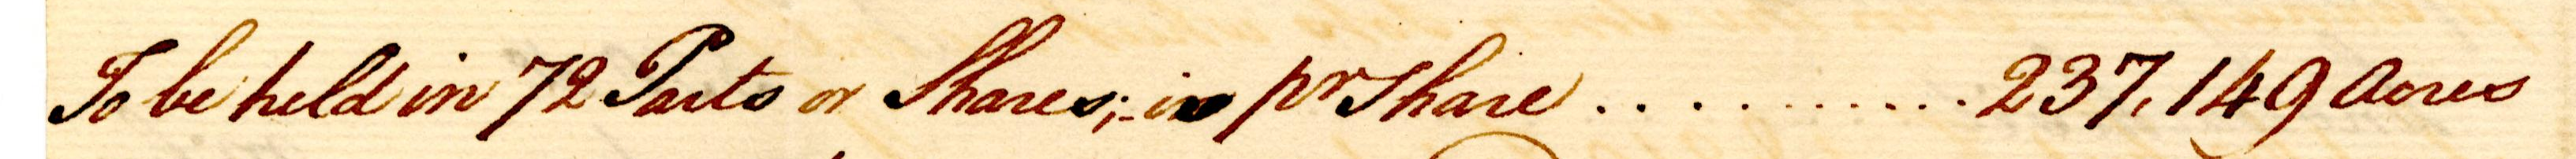To be held in 72 Parts or Shares; in p^r Share......... 237,149 Acres
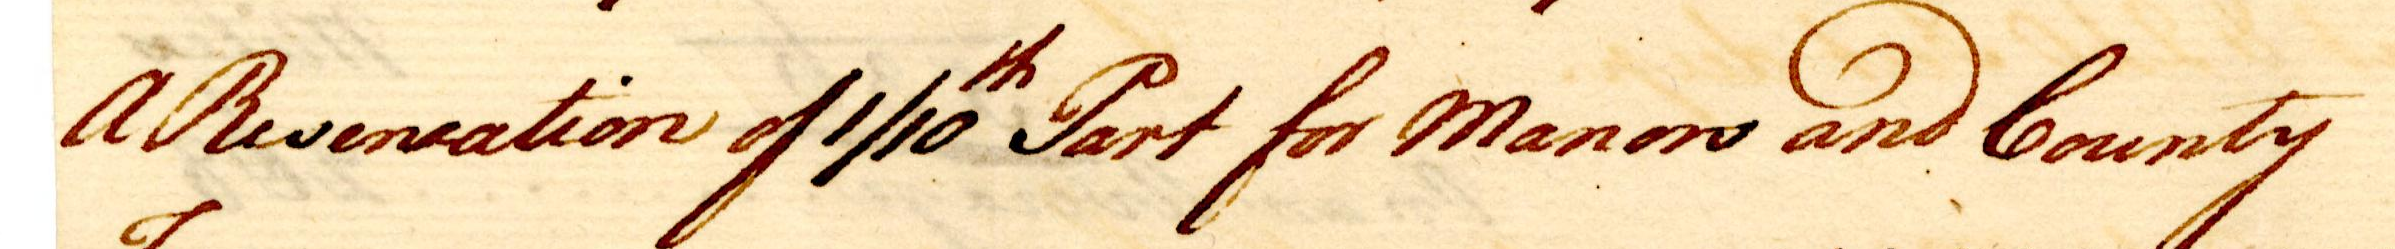A Reservtation of 1/10^th Part for Manors and County
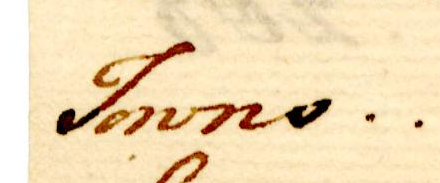Towns.
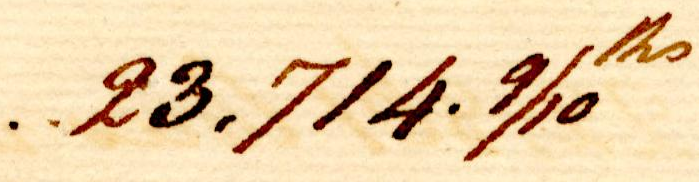23,714. 9/10^th
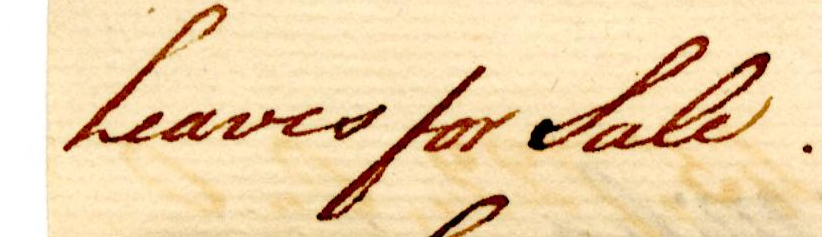Leaves for sale
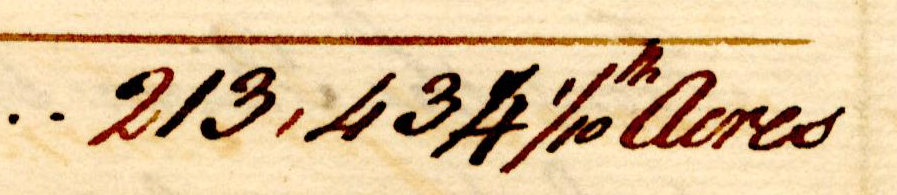.213,434 1/10^th acres
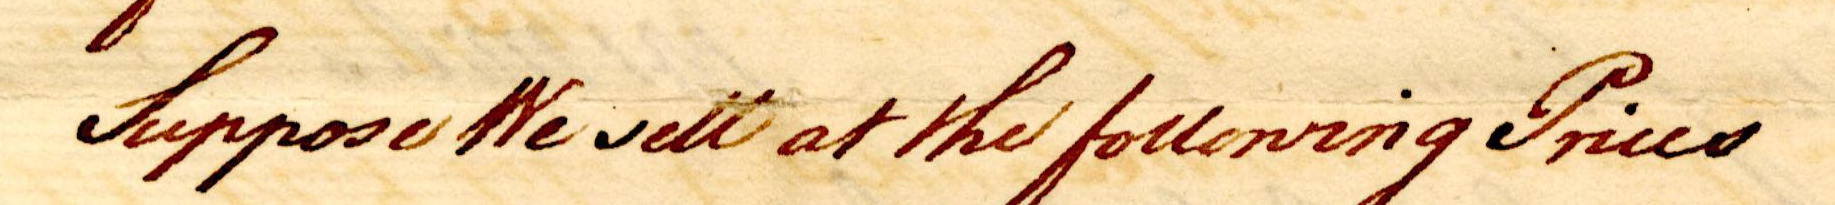Suppose We sell at the following Prices
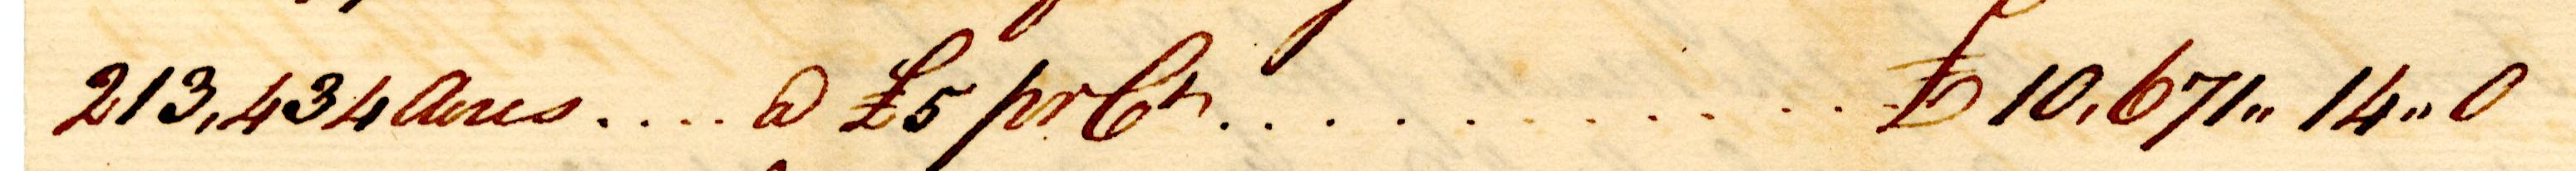213,434 acres.... @ £5 pr C^t.- £10,671.14.0
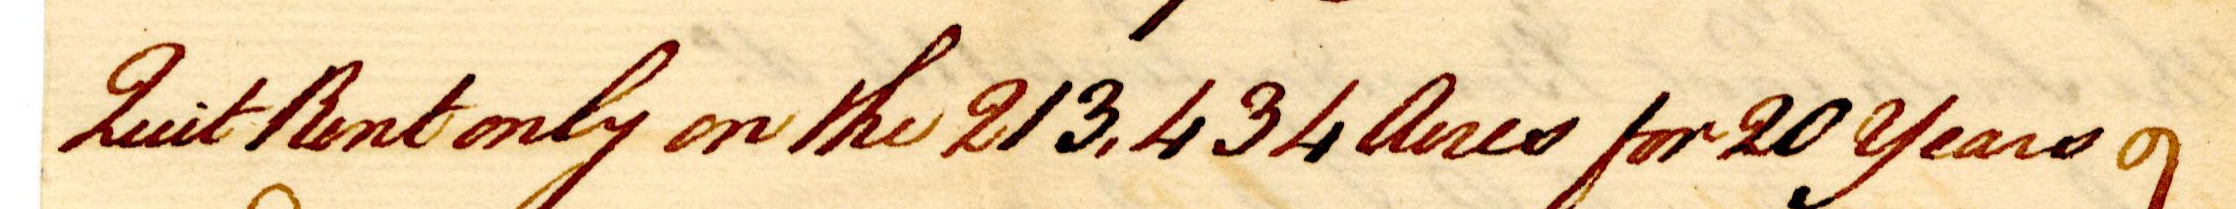Quit Rent only on the 213,434 Acres for 20 Years as
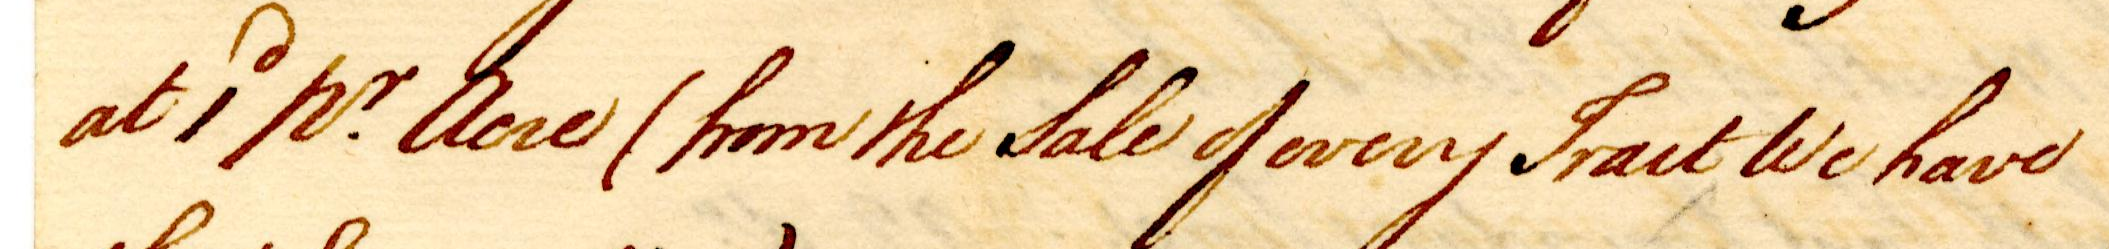at 1^d p^r. acre (from the sale of every tract We have
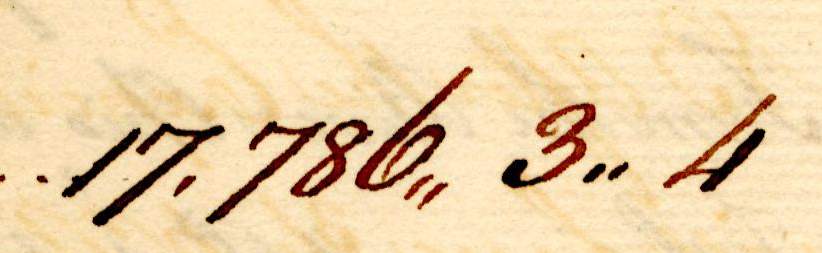17,786.3.4
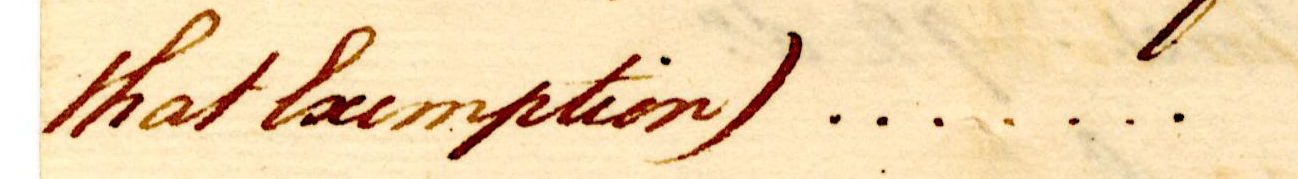that exemption).
